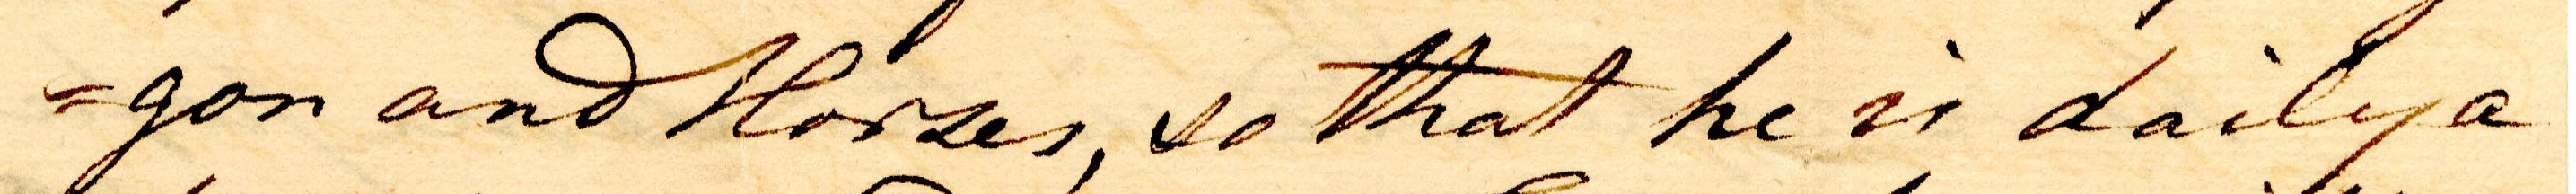-gon and Horses, so that he is daily a
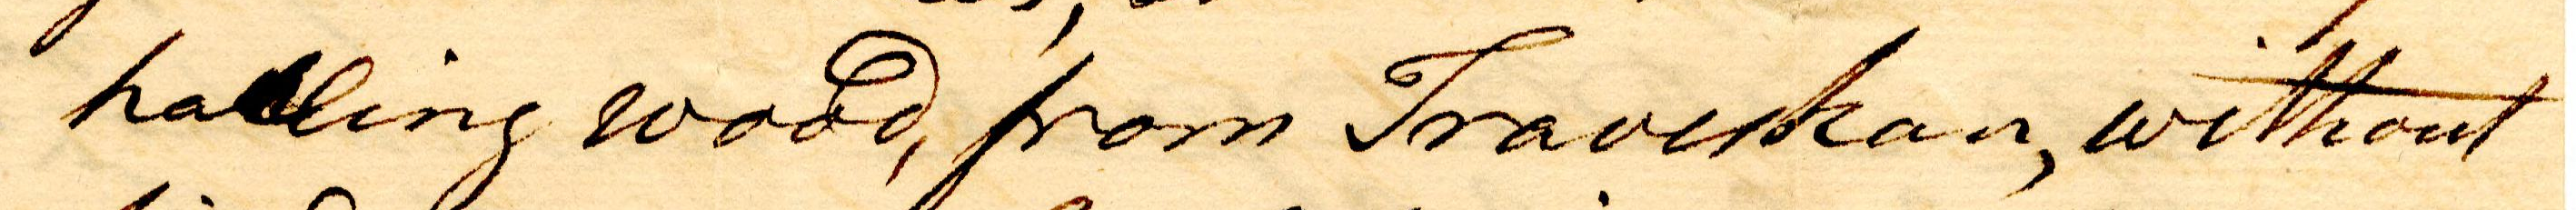hauling wood, from Traveskan, without
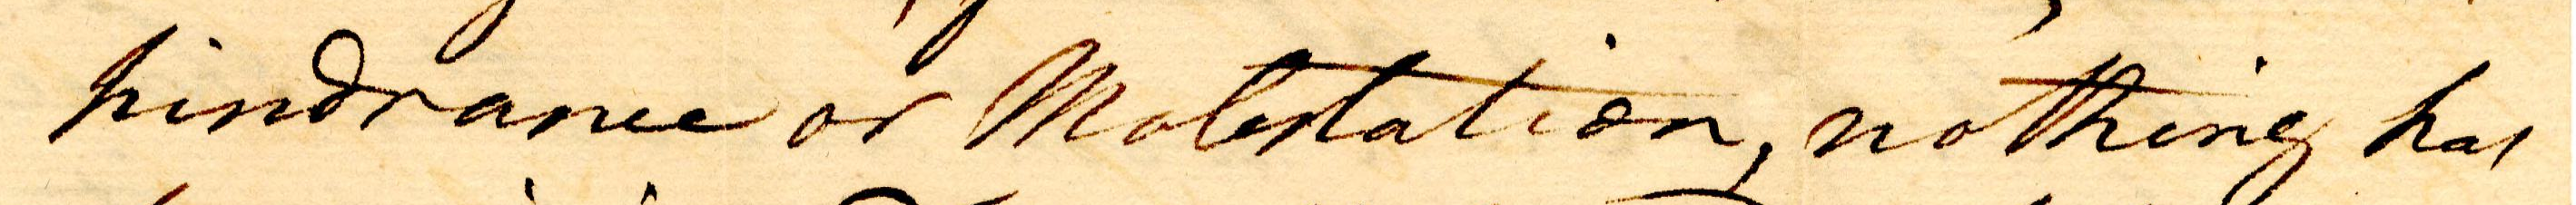hindrance or Molestation, nothing has
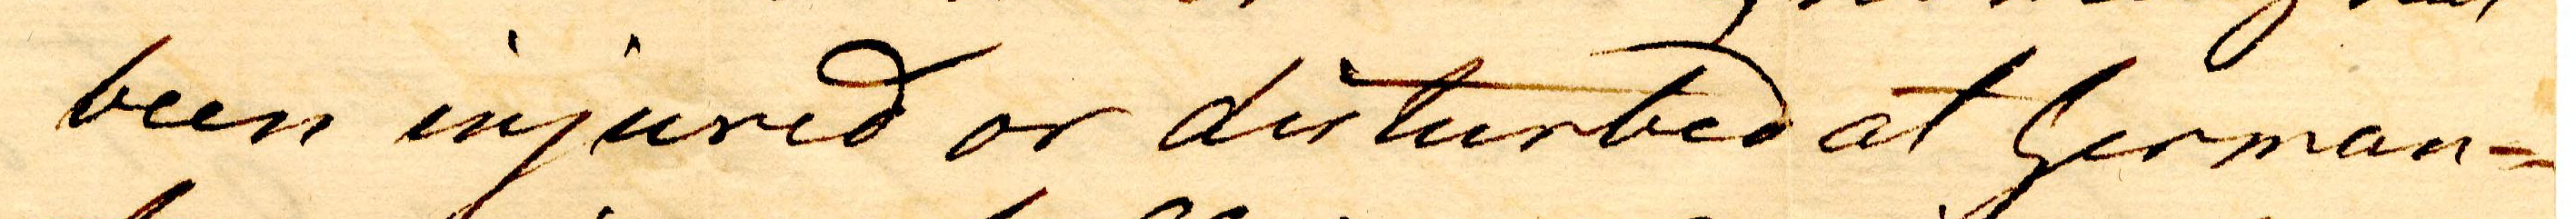been injured or disturbed at German-
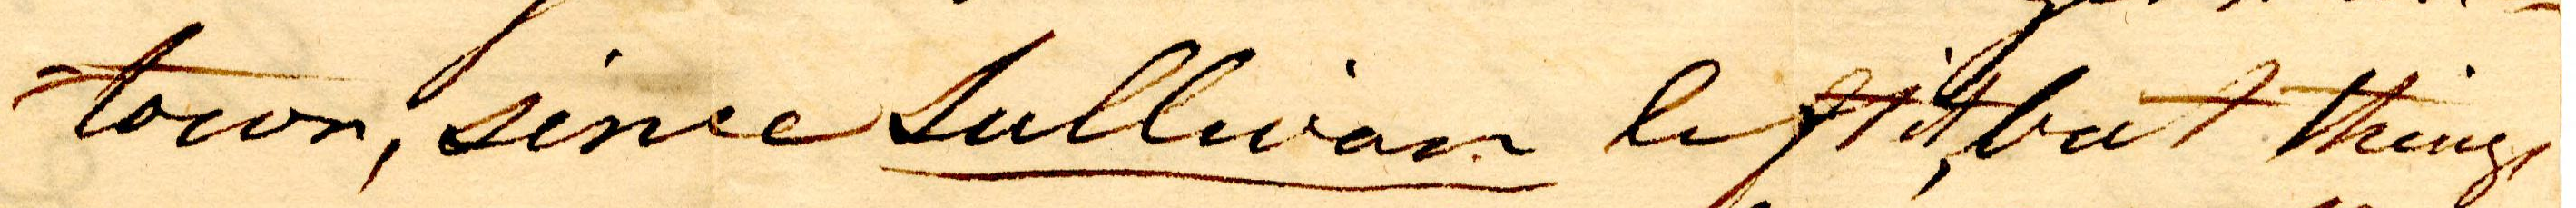-town, since Sullivan left it, but things
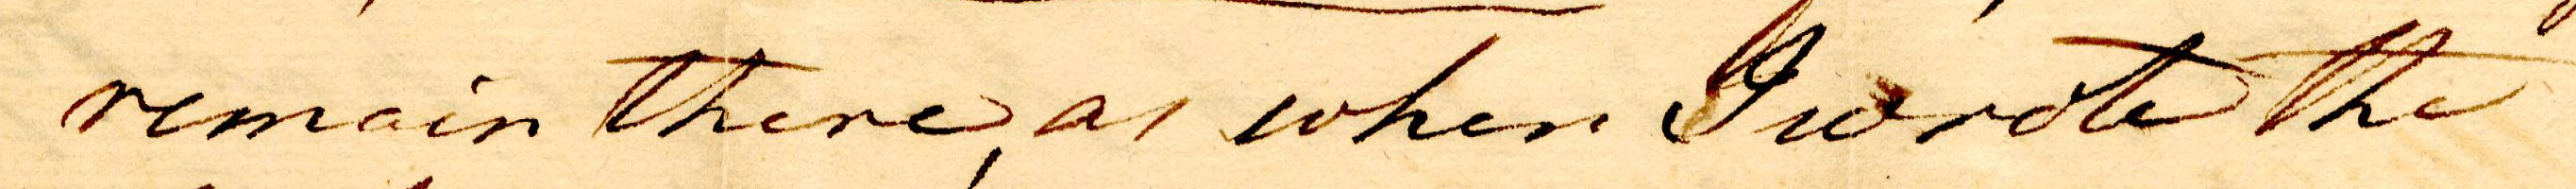remain there, as when I wrote the
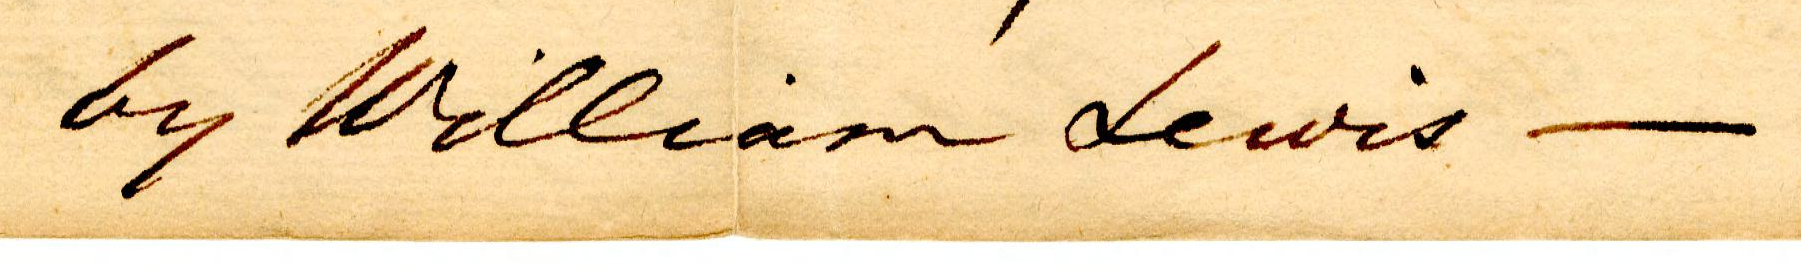by William Lewis-
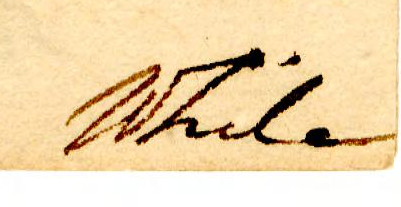While
